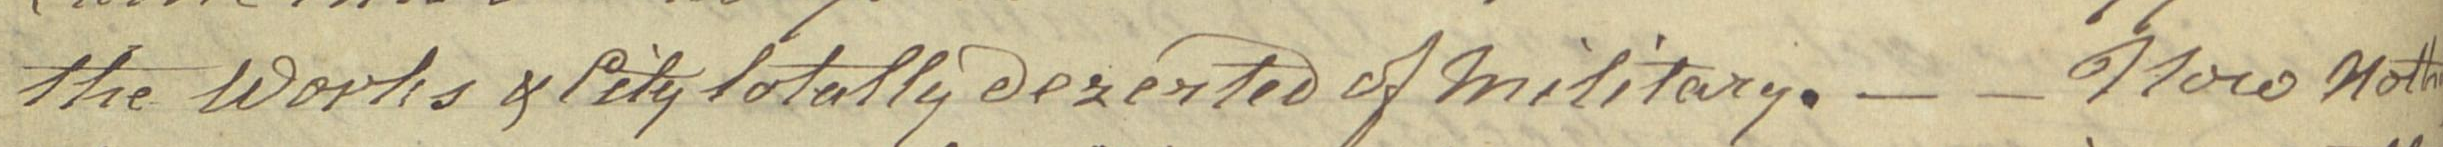The Works & city totally deserted of military.- Now noth-
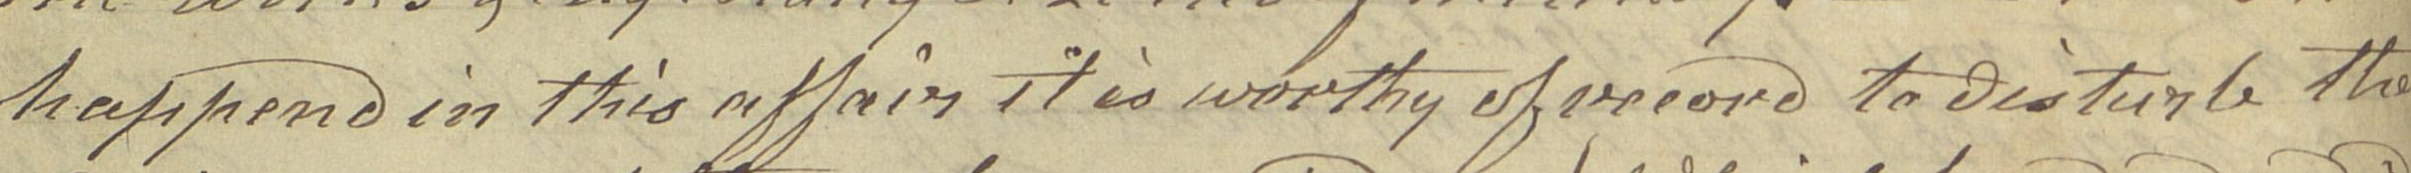happend in this affair it is worthy of record to disturb the
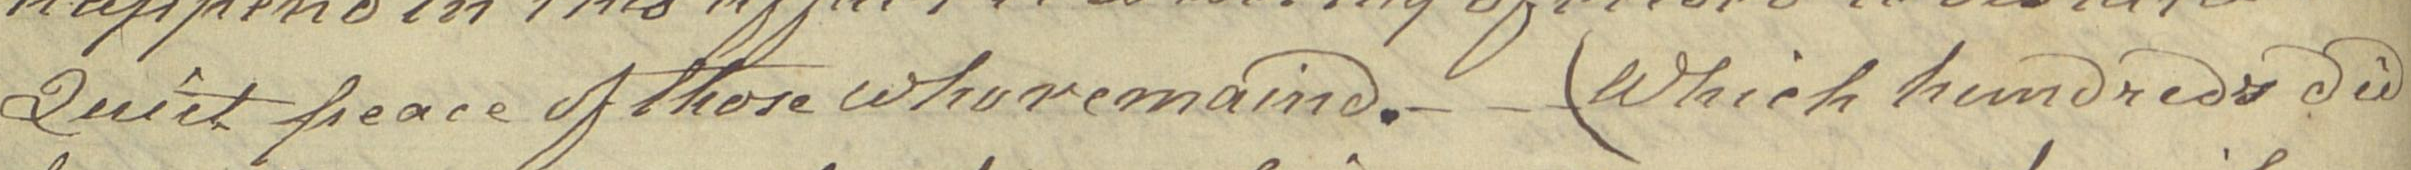Quiet peace of those who remaind. (Which hundreds did
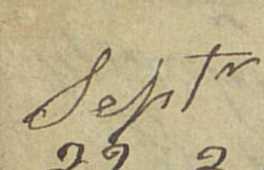Sept^r
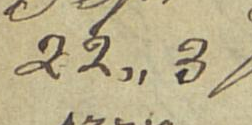22..3
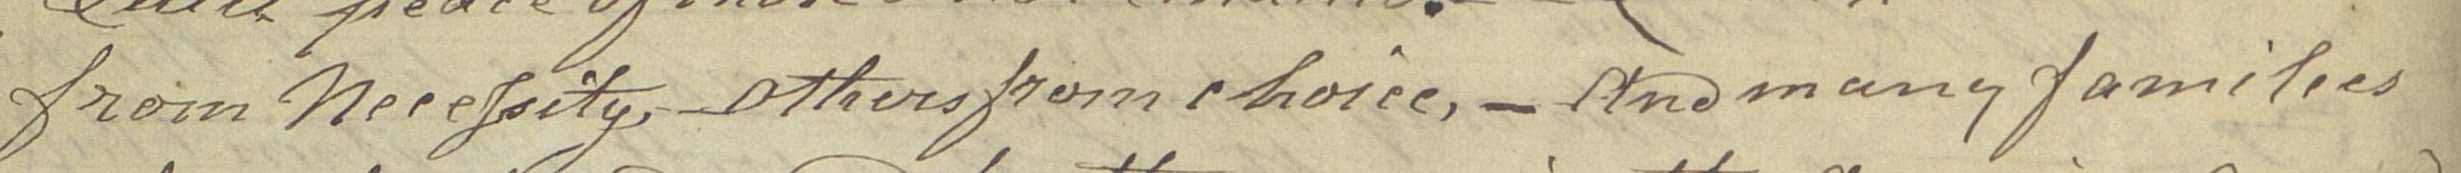from Necessity, others from choice, And many families
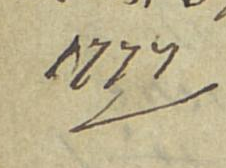1777
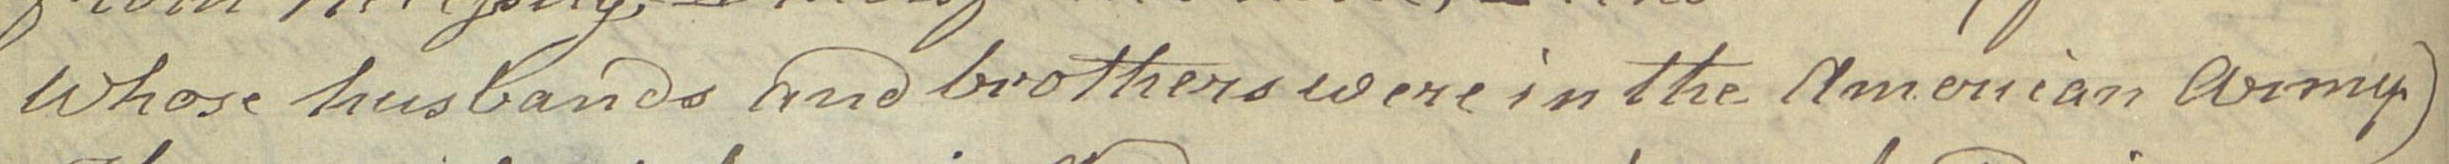whose husbands and brothers were in the American Army)
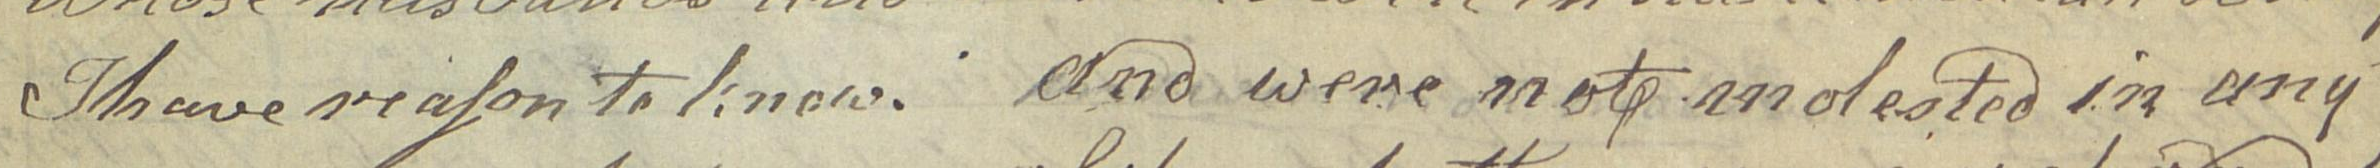I have reason to know. And were note molested in any
